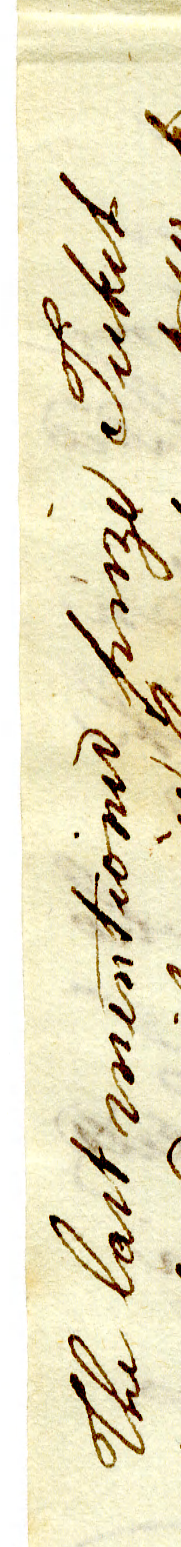The last mentioned prize Ticket
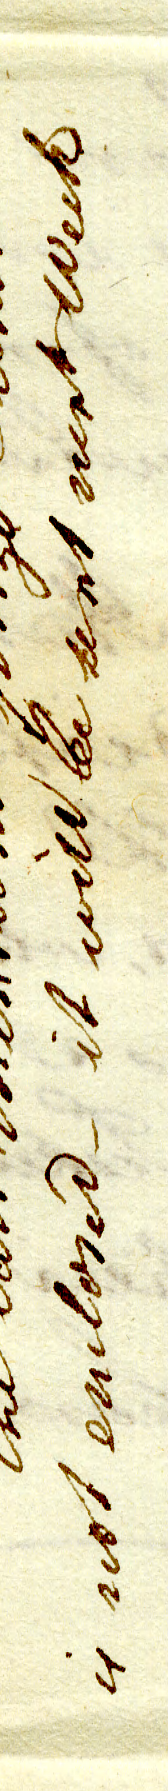is not enclosed- it will be sent next Week
